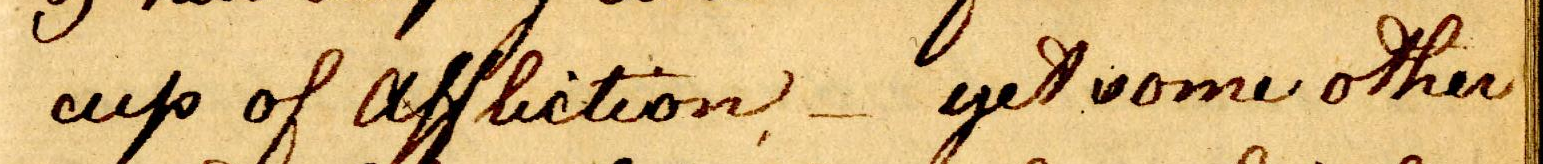cup of Affliction- yet some other
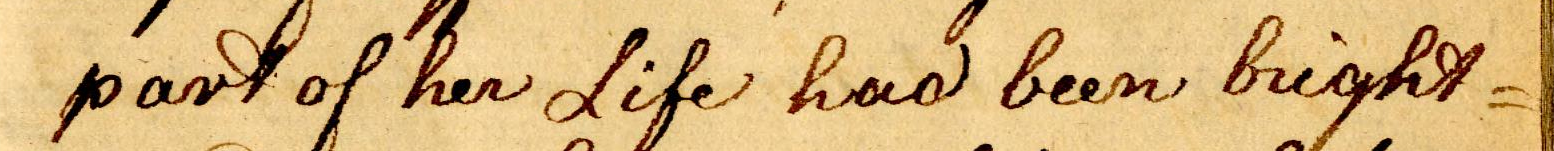part of her Life had been bright-
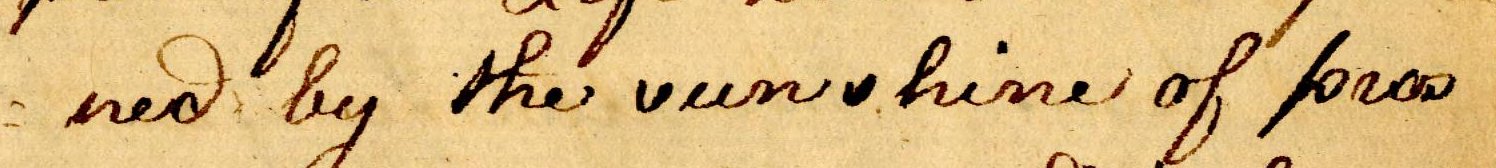-ned by the sun shine of pros
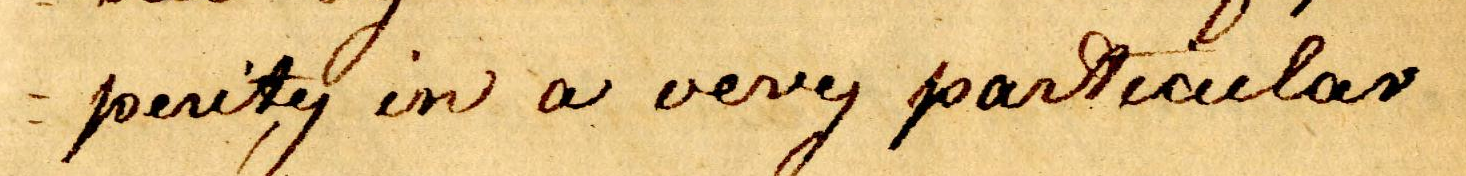-perity in a very particular
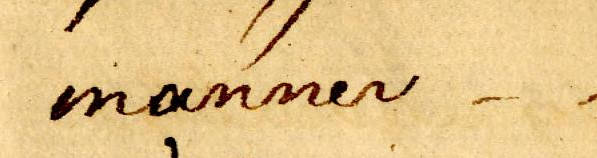manner-
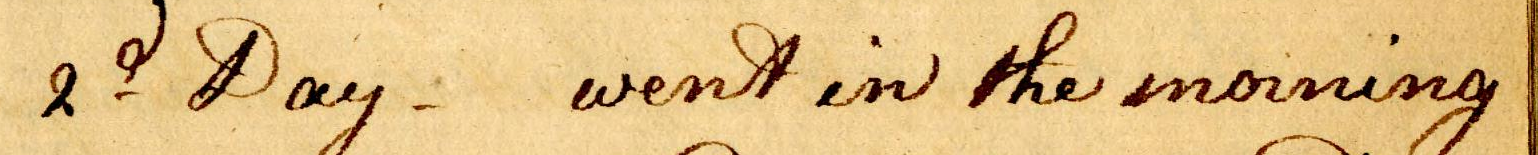2^d Day- went in the morning
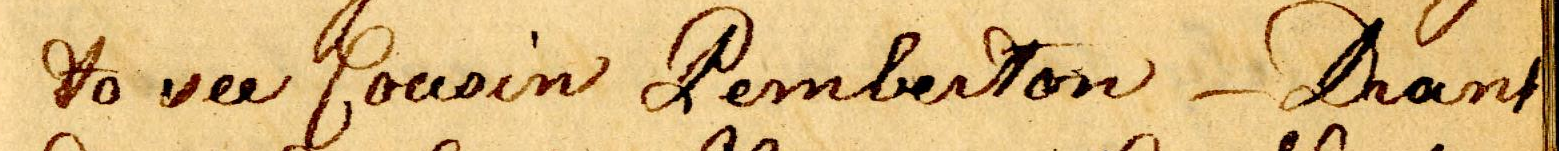to see Cousin Pemberton- Drank
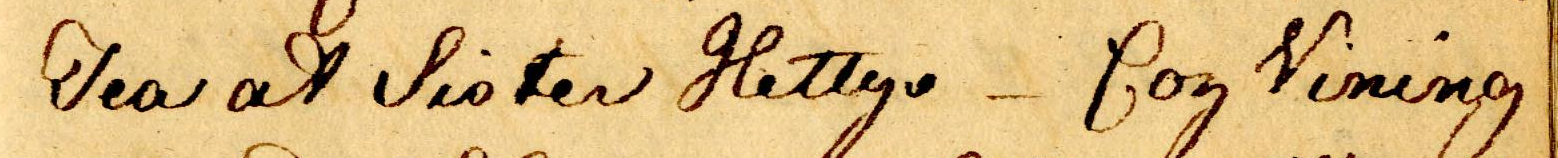Tea at Sister Hettys- Coz Vining
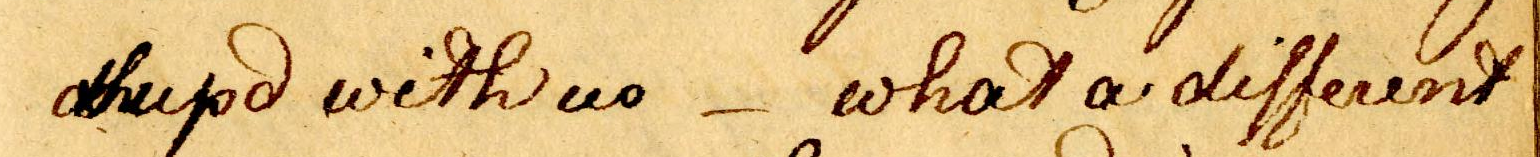Supd with us - what a different
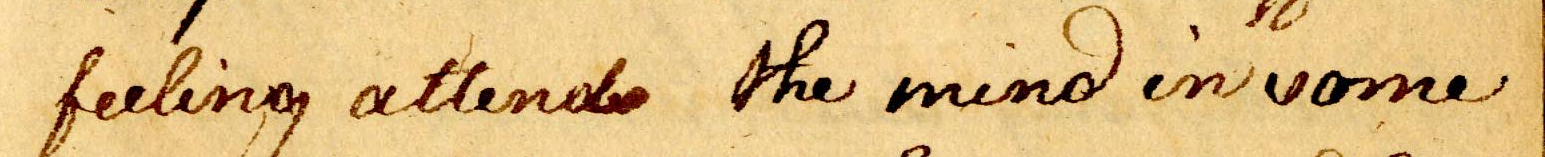feeling attends the mind in some
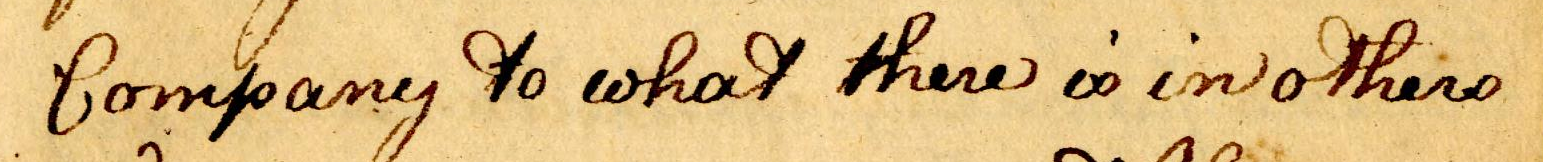Company to what there is in others
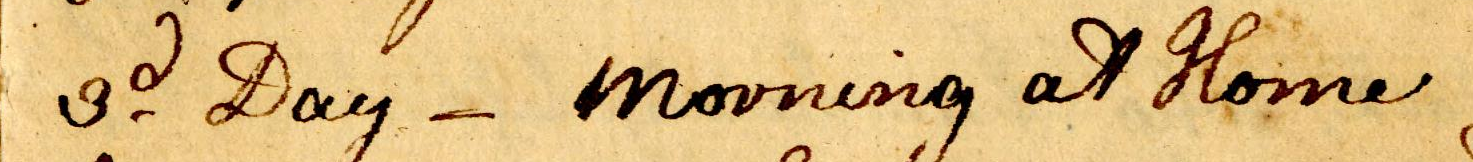3^d Day- Morning at Home
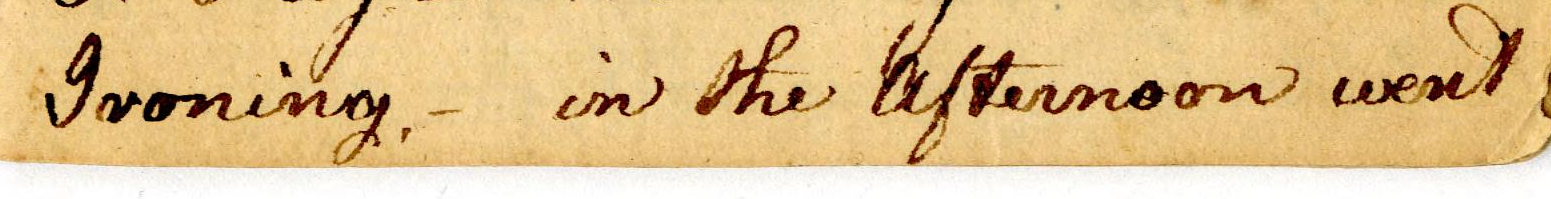Ironing,- in the Afternoon went
